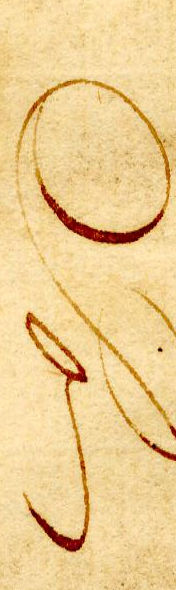To
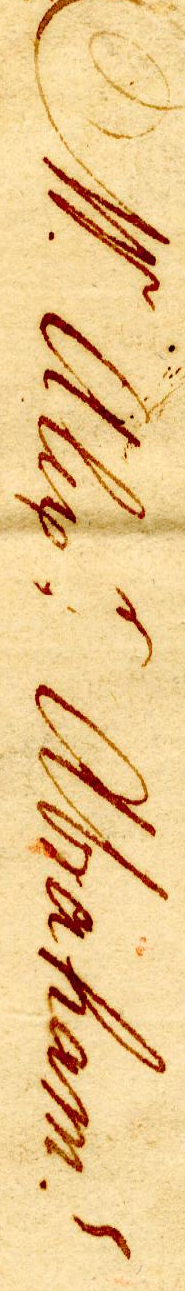M^r Alex^r. Abraham
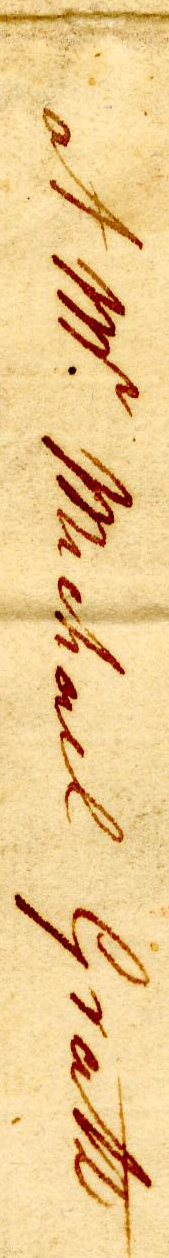A M^r Michael Gratz
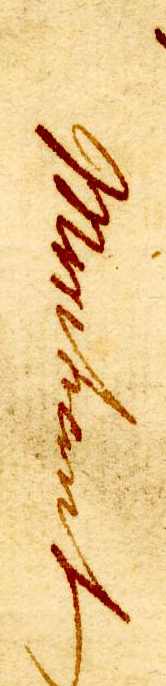Merchants
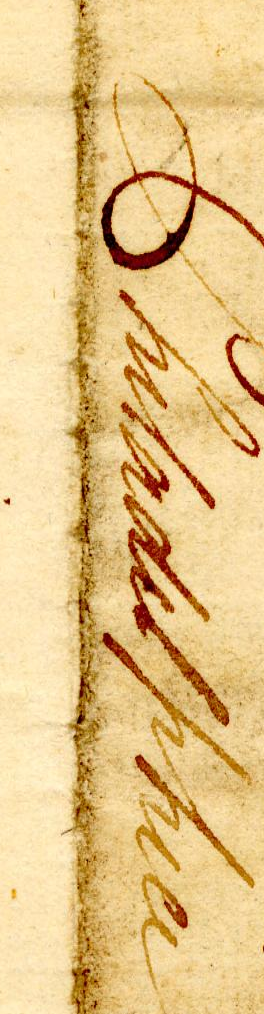Philadelphia
